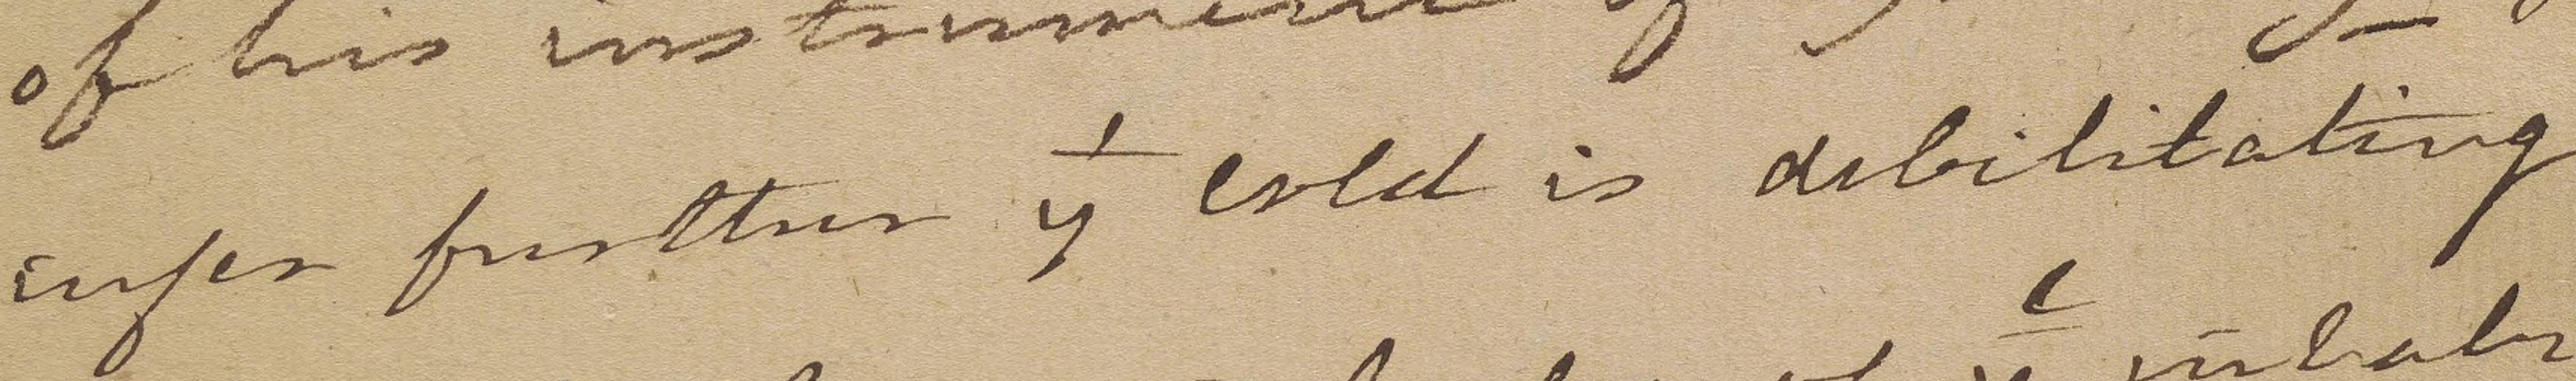infer further y^e cold is debilitating
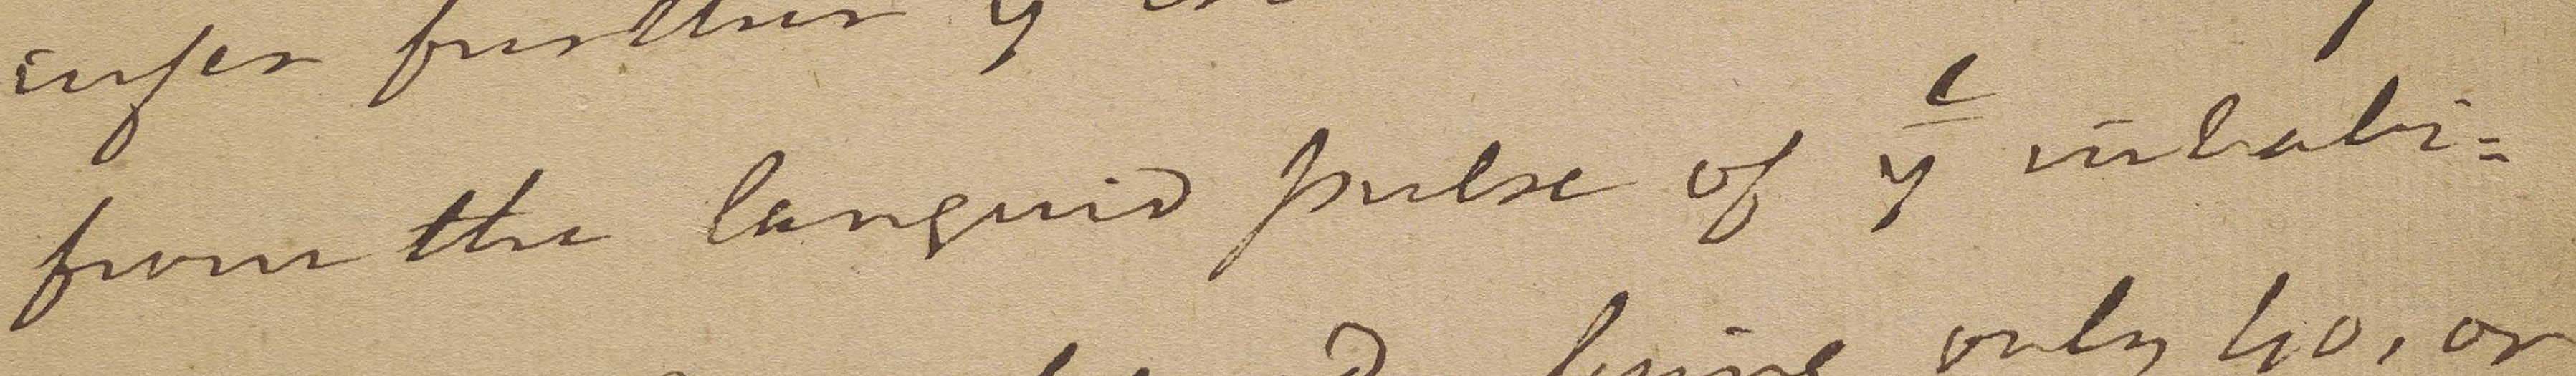from the languid pulse of y^e inhabi-
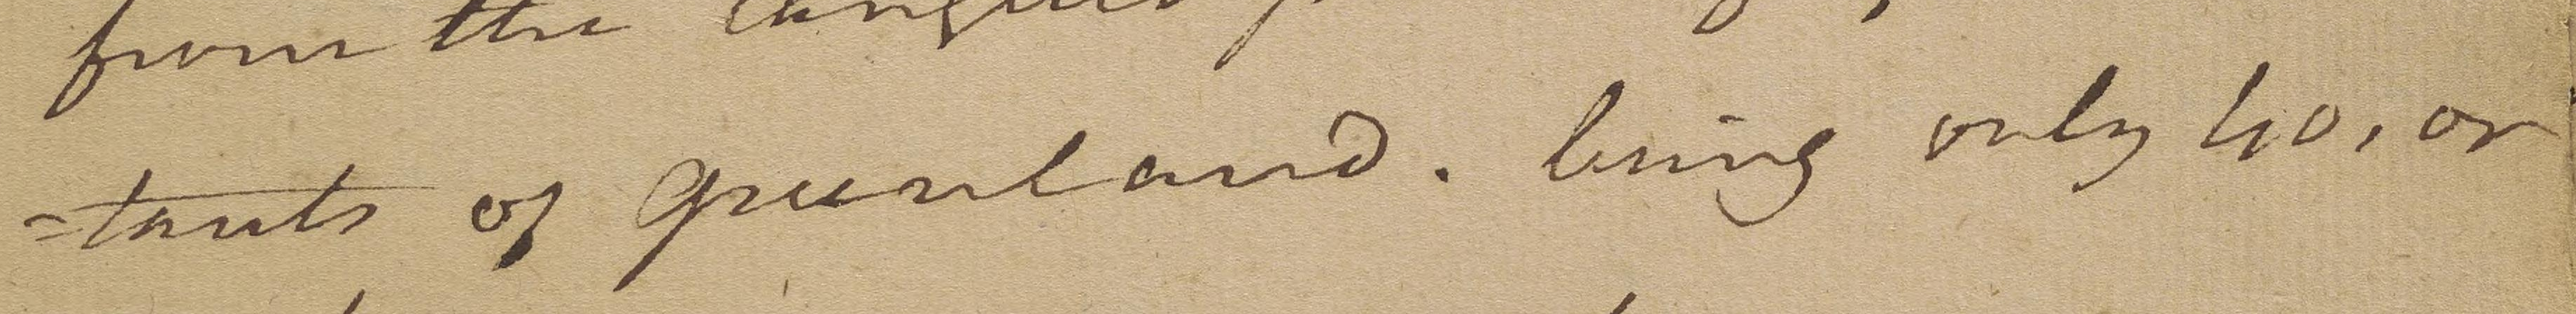-tants of Greenland being only 40, or
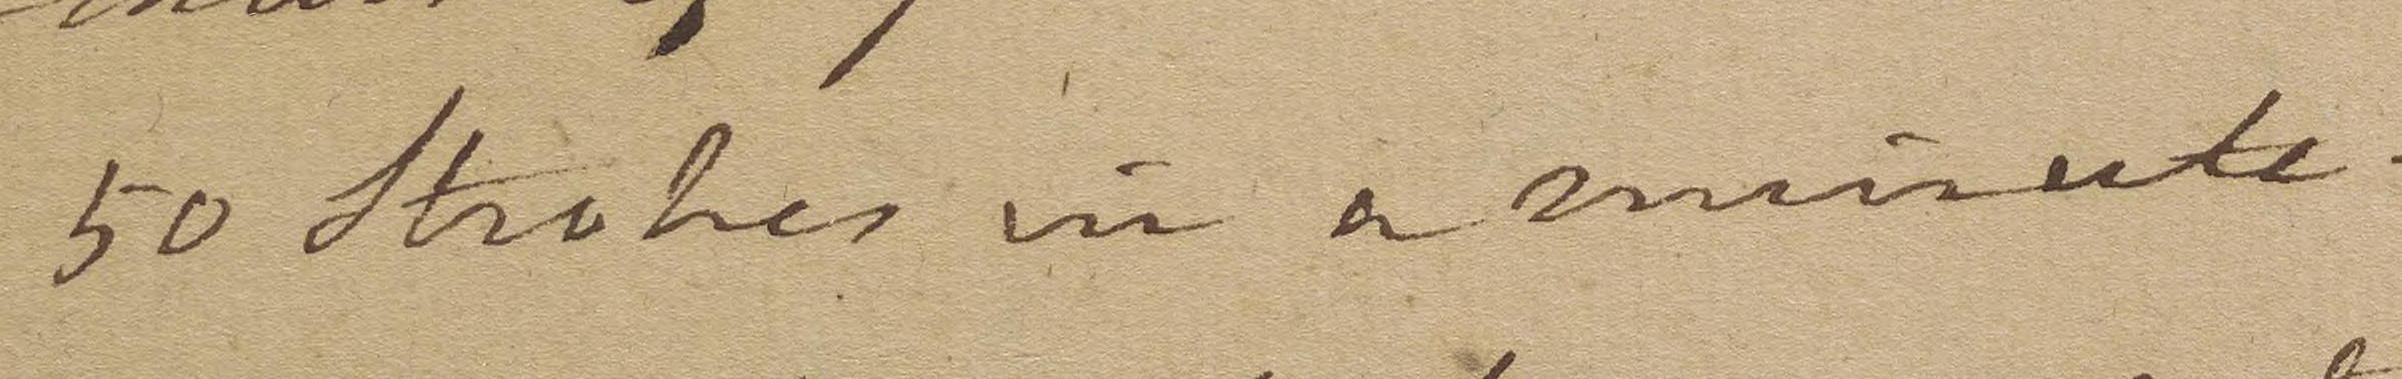50 strokes in a minute.
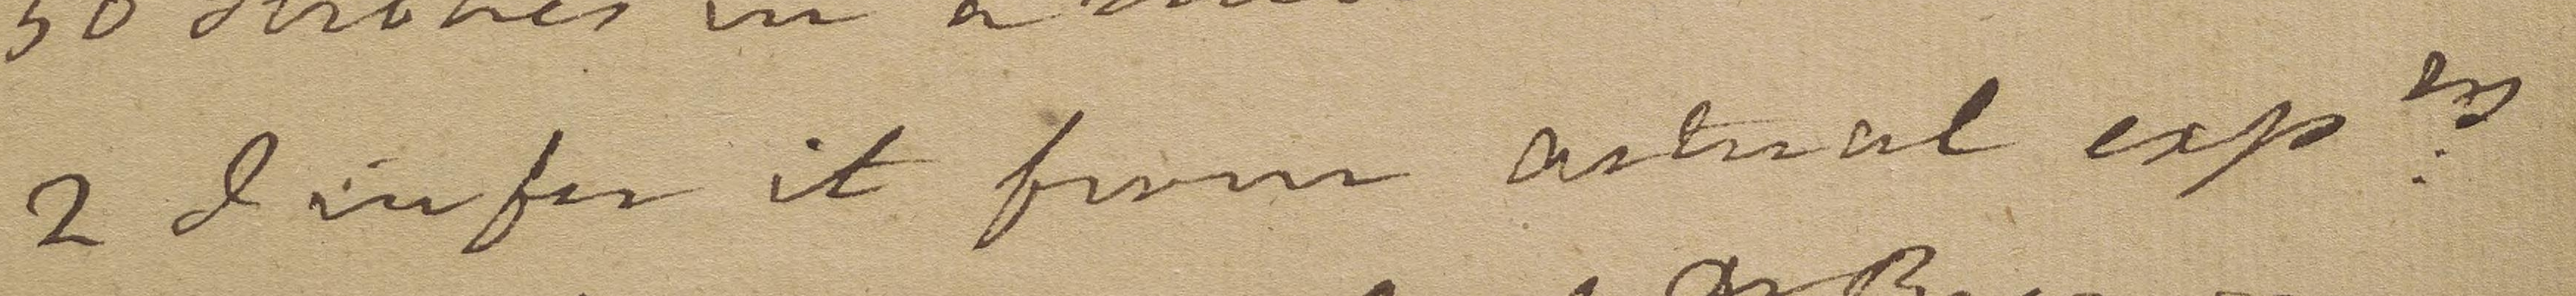2 I infer it from arteral exp^n
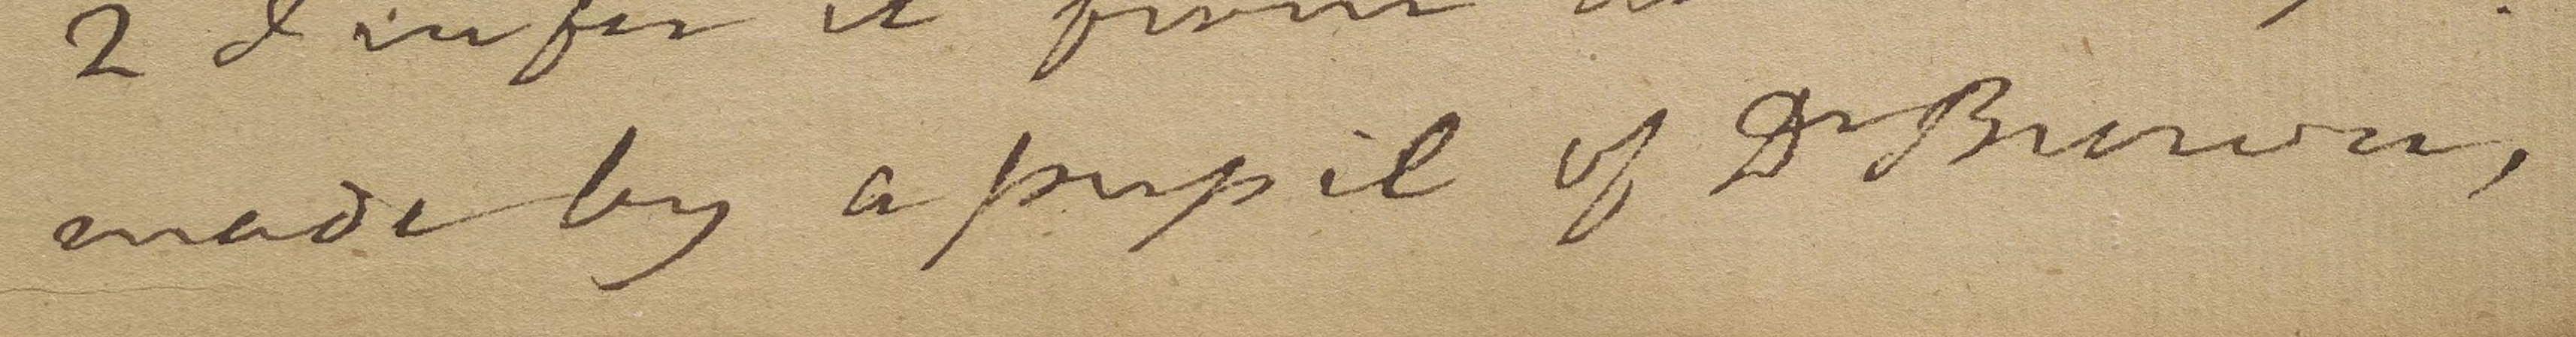made by a pupil of D^r Brown,
